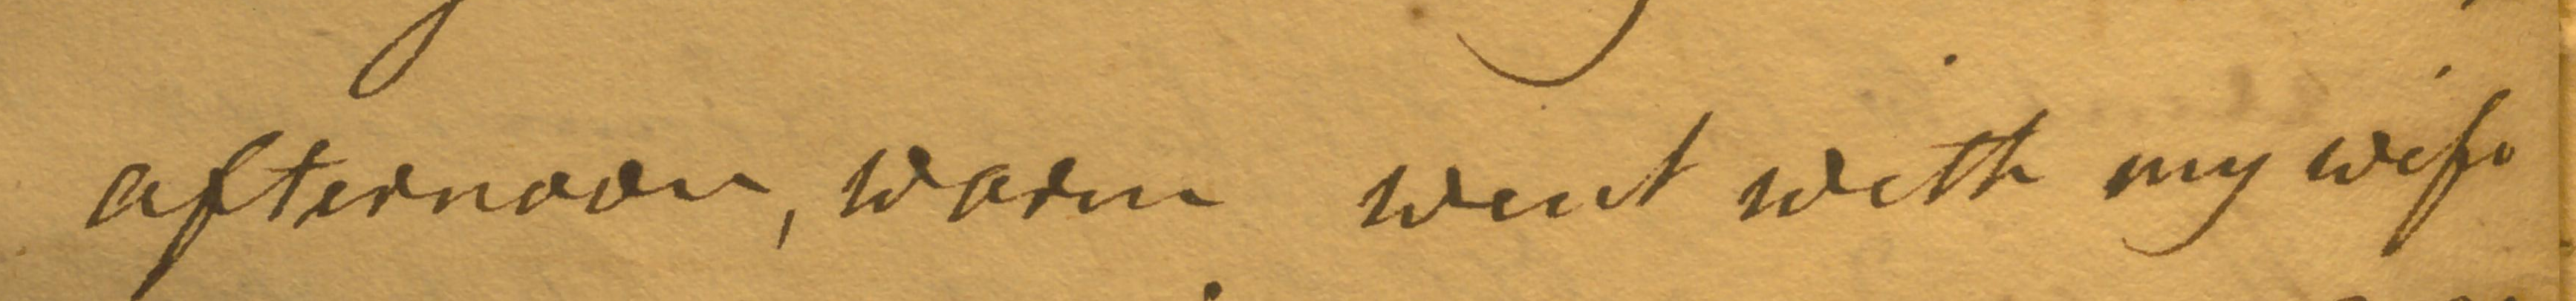afternoon, warm went with my wife
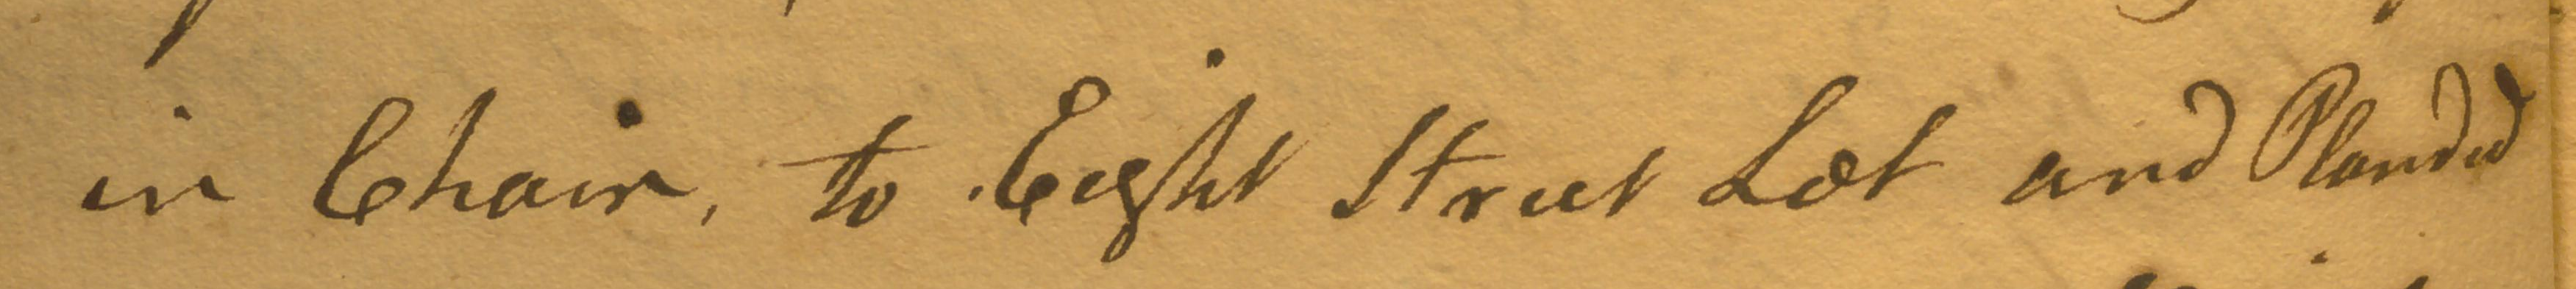in Chair, to Eight Street Lot and Planded
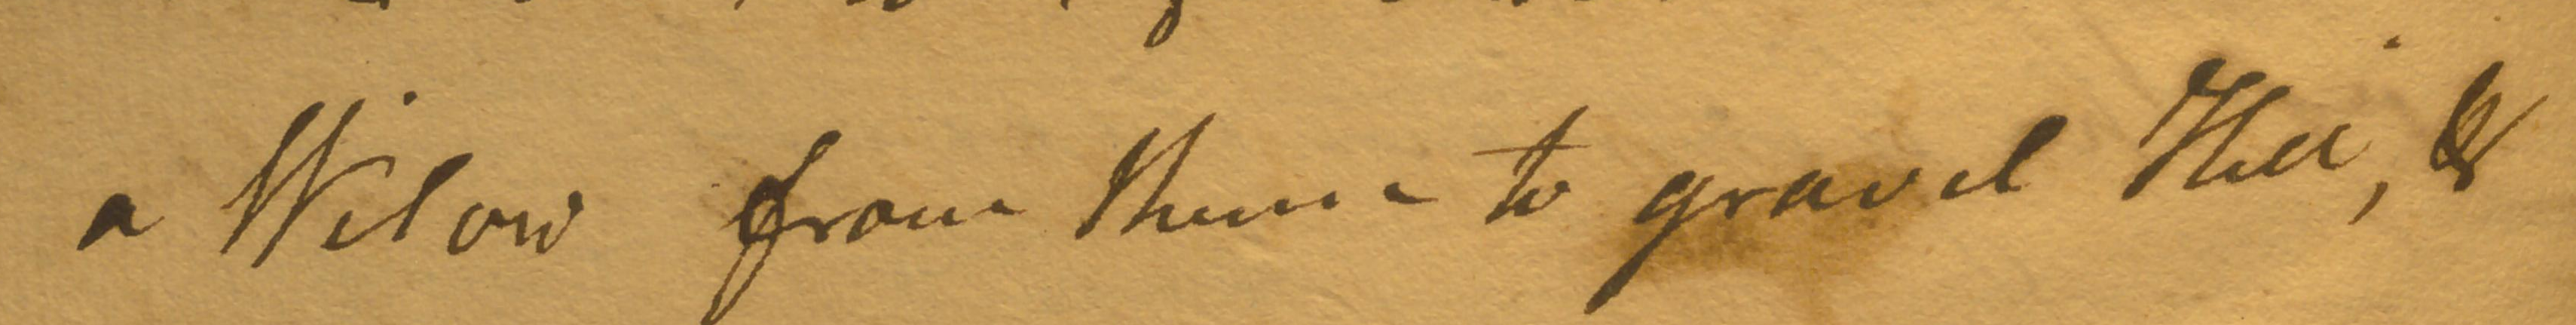a Wilow from theme to gravel Hill, &
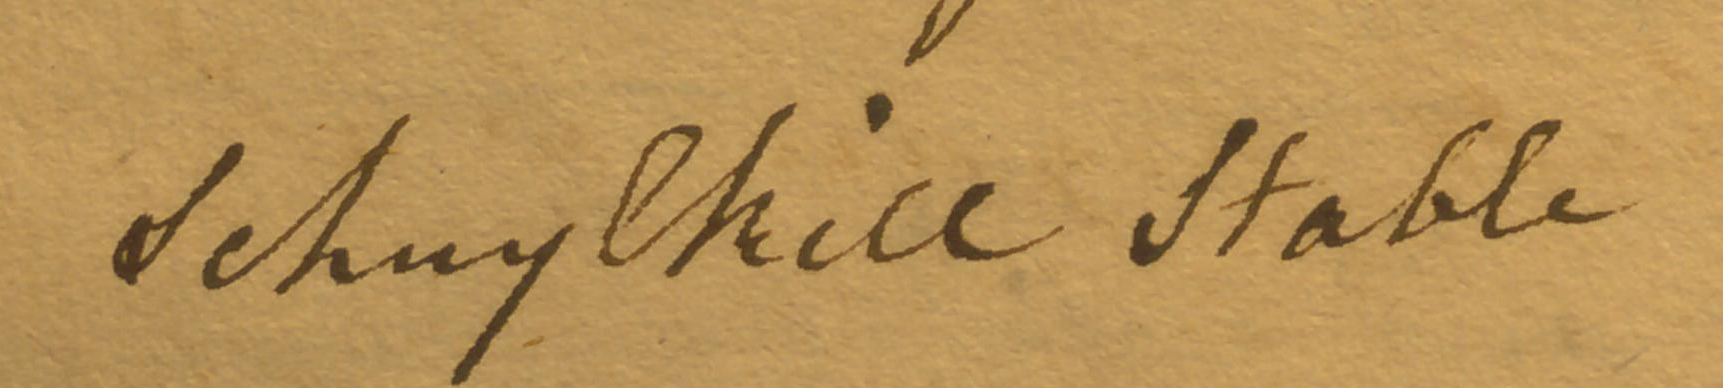Schuylkill Stable
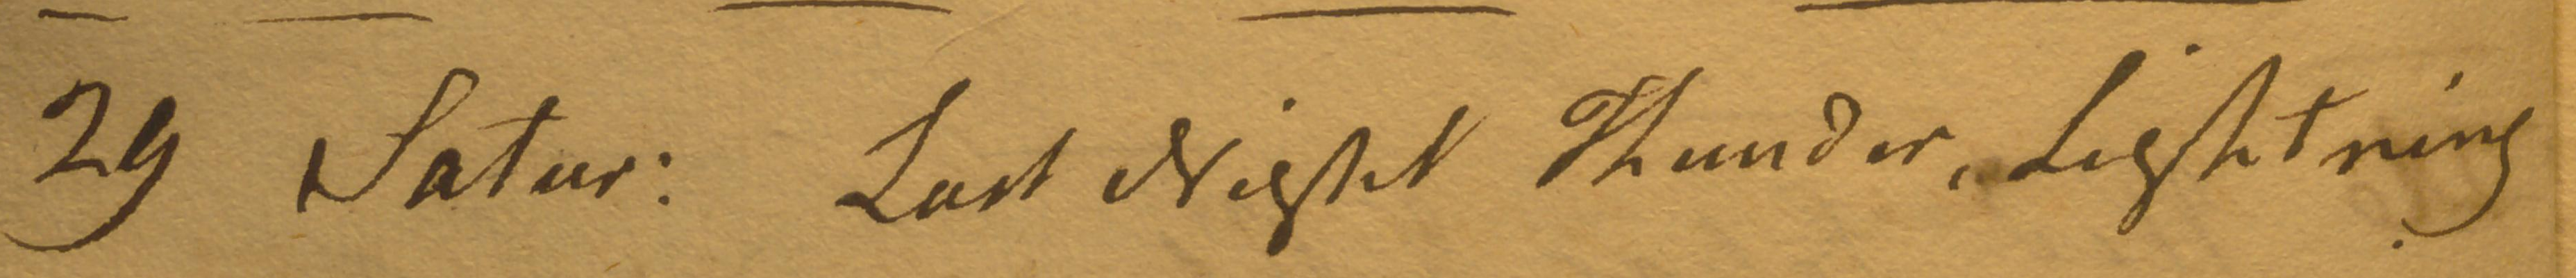29 Satur: Last Night Thunder, Lightning
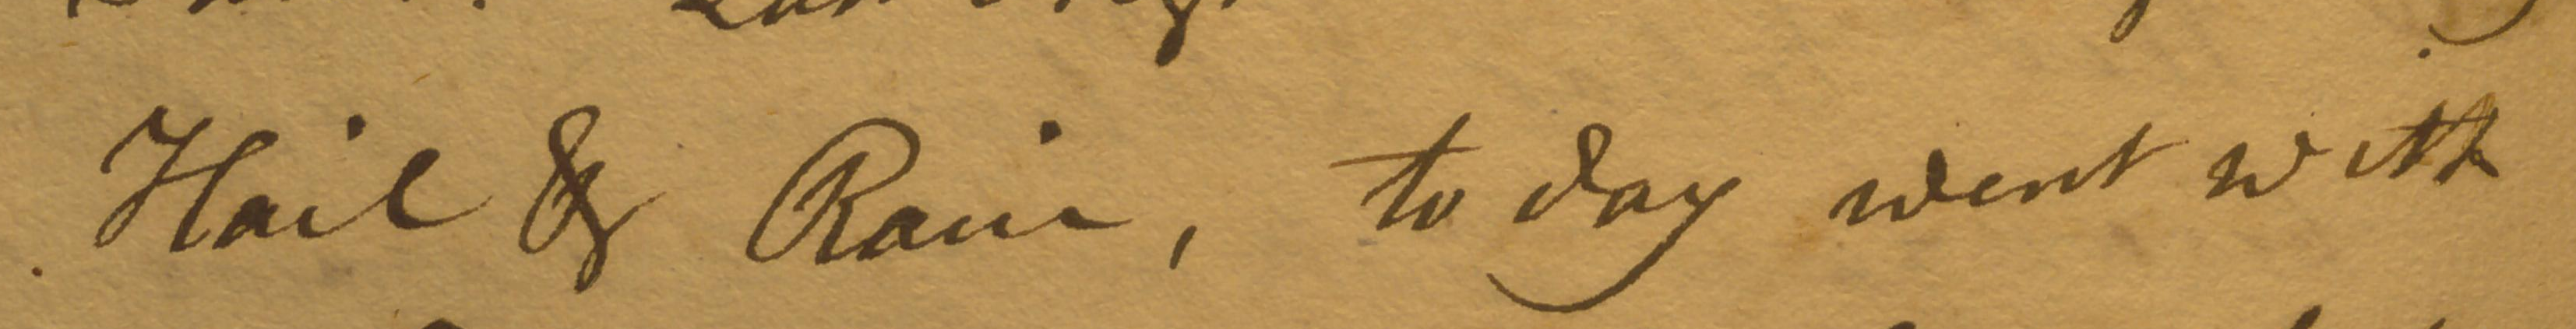Hail & Rain, to day went with
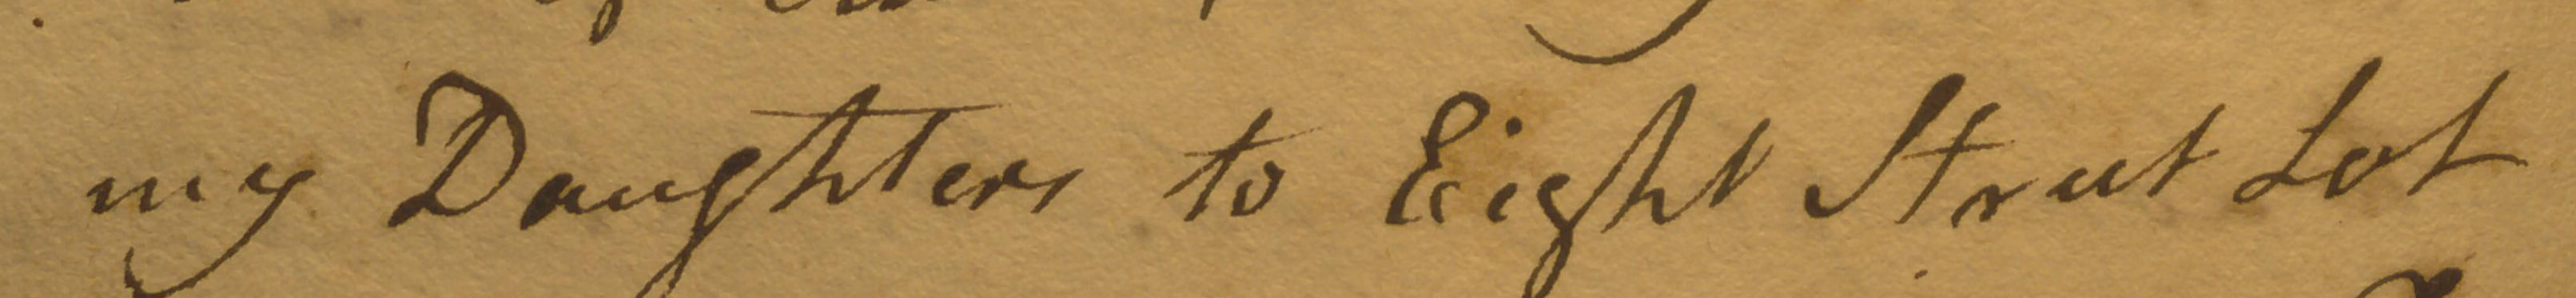my Daughters to Eight Street Lot
